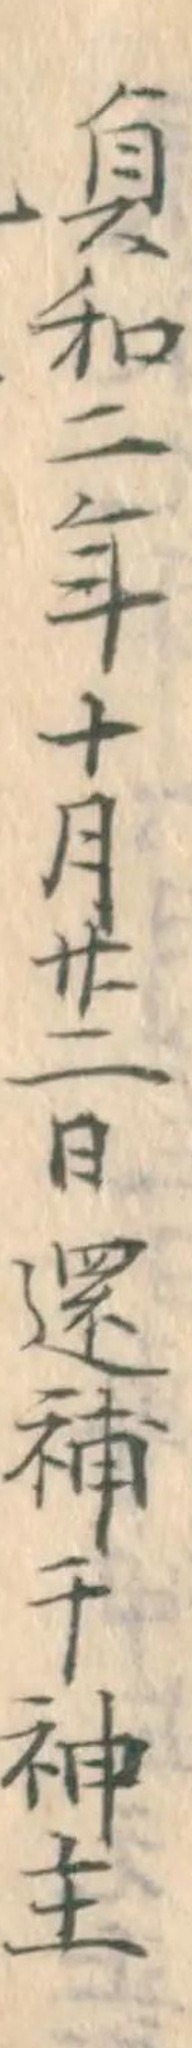教久貞和二年十月廿二日還補于神主
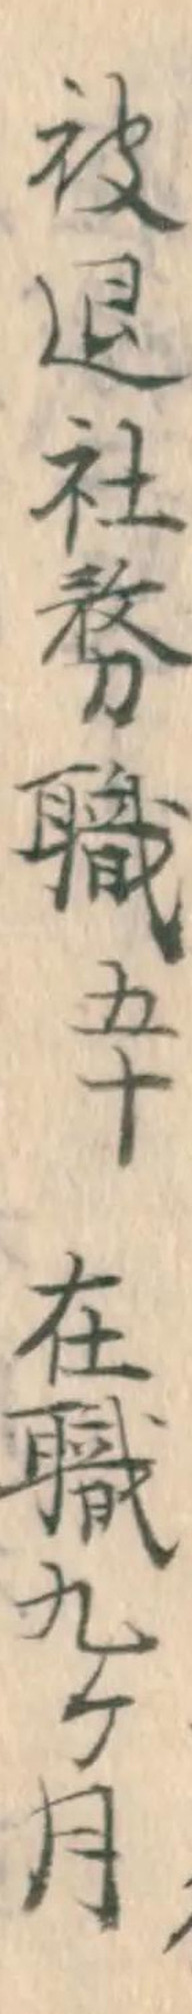被退社務職五十在職九ヶ月
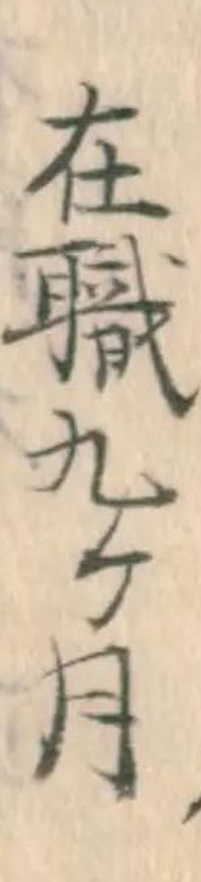在職四ヶ月
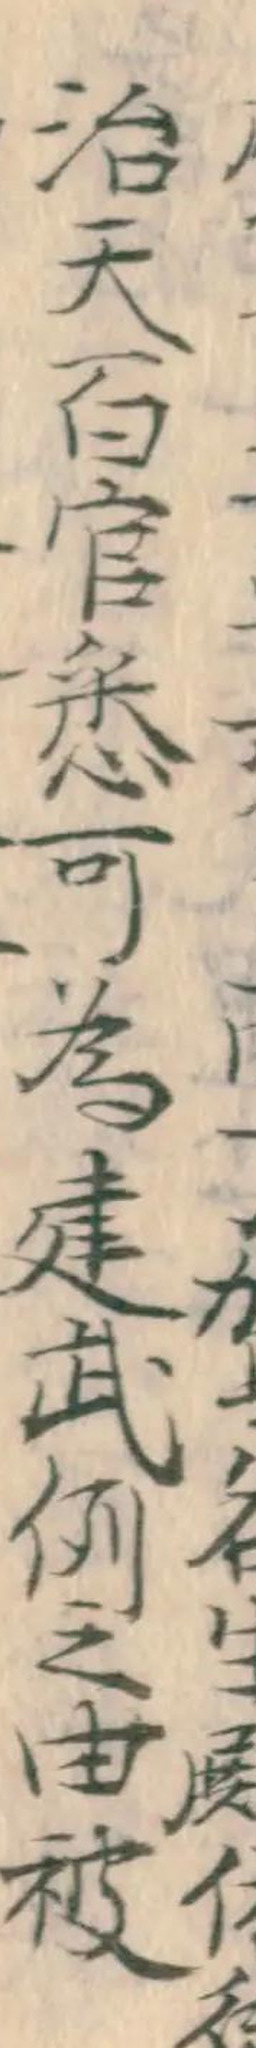治天百官悉可為建武例之由被
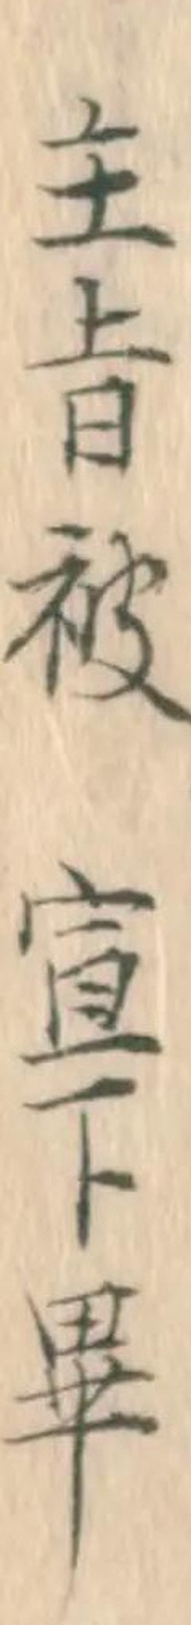主旨被宣下畢
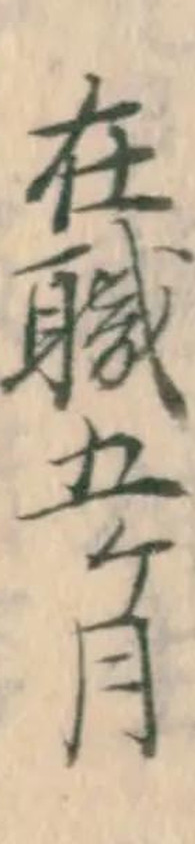在職四ヶ月
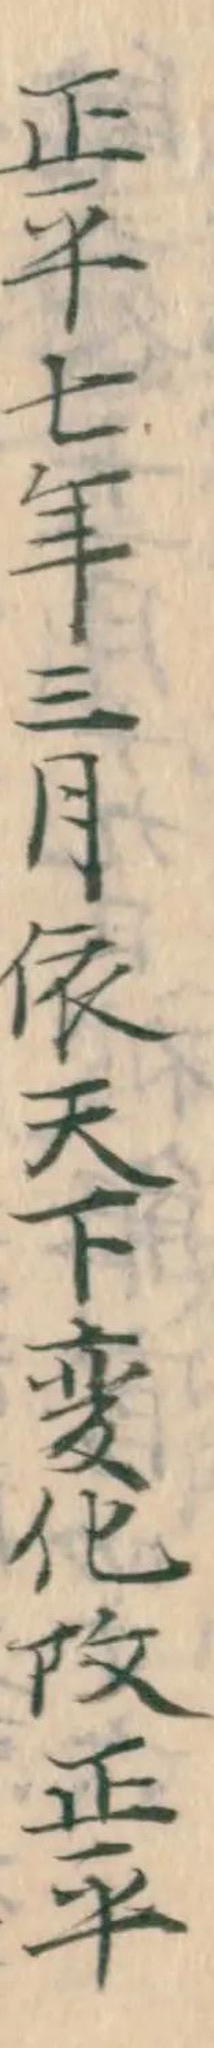員平正平七年三月依天下変化改正平
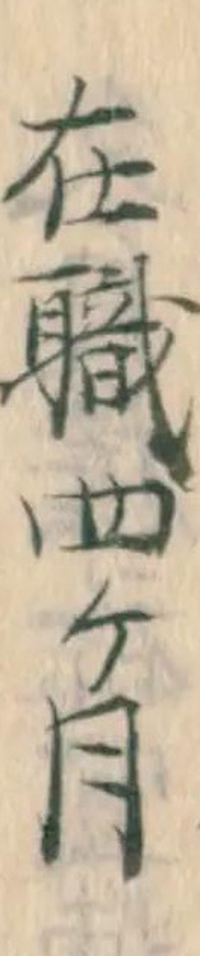在職四ヶ月
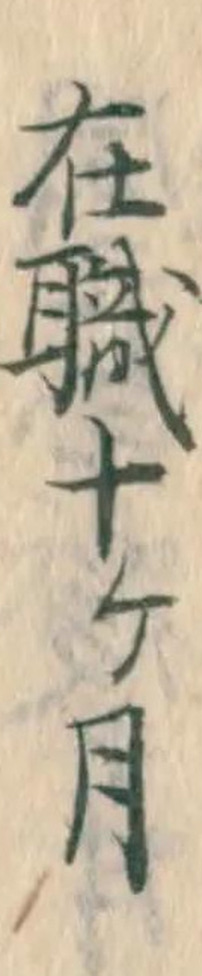在職四ヶ月
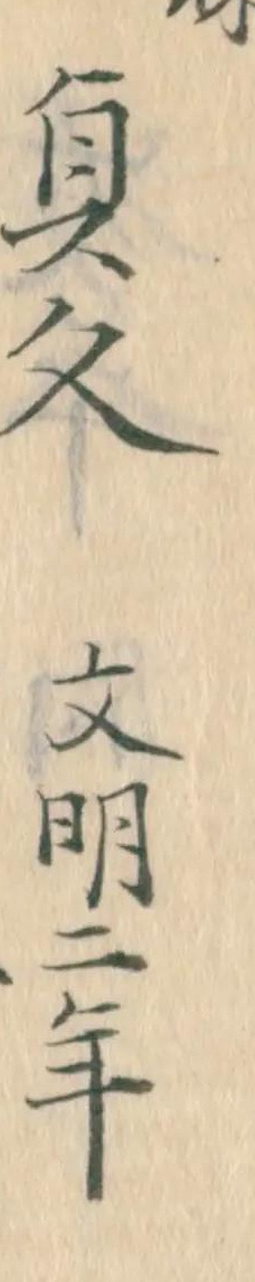弥久文明九年
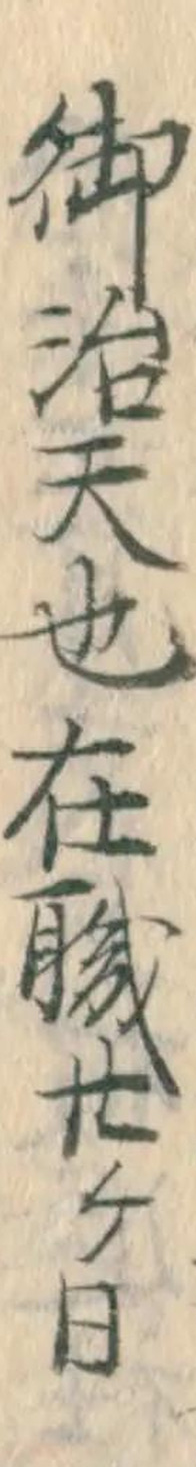御治天也在職廿ヶ日

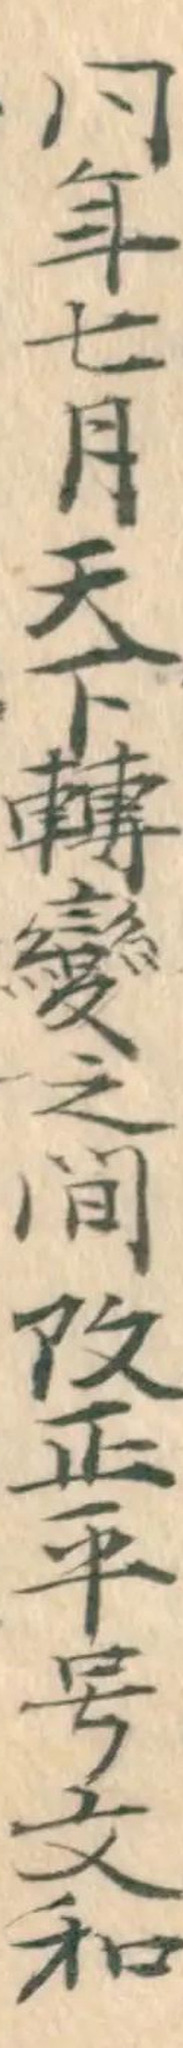同年七月天下転変之間改正平号文和
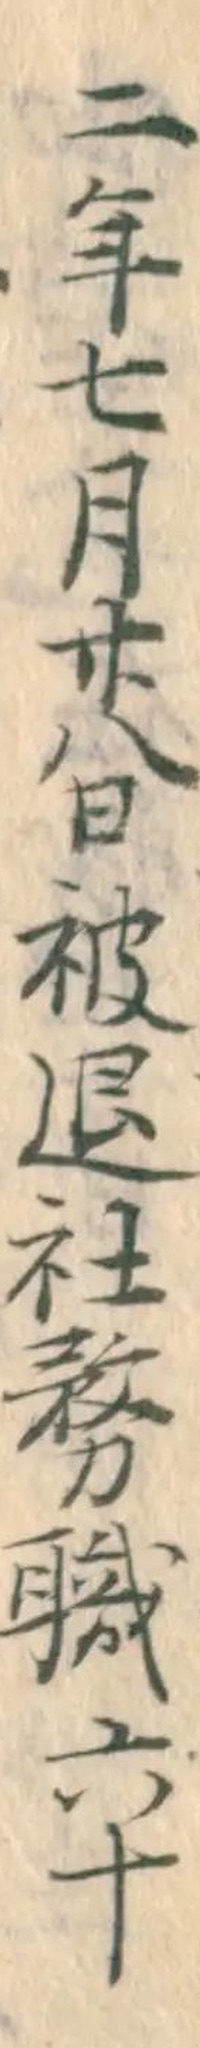二年七月廿八日被退社務職六十
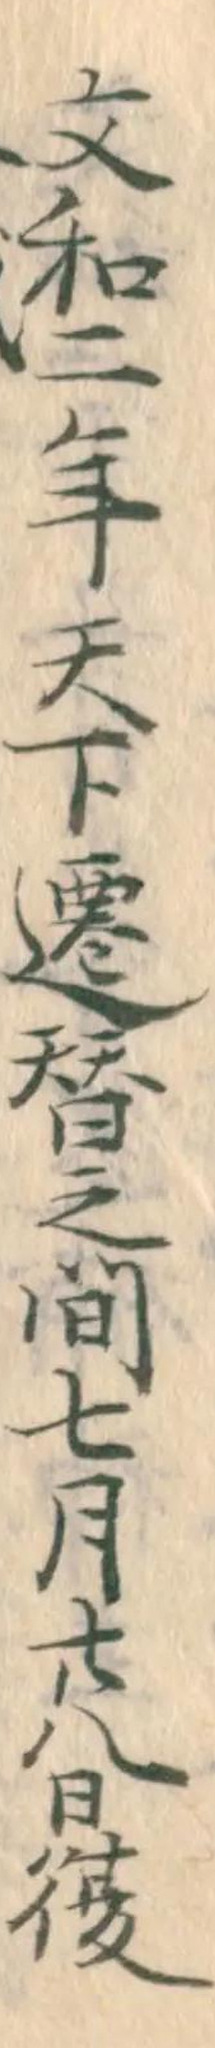教文文和二年天下遷替之間七月廿八日復
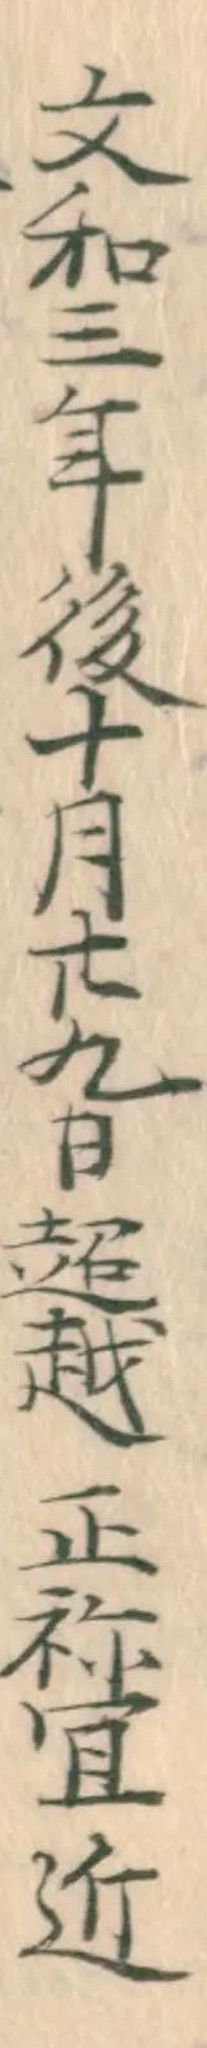国久文和三年後十月廿九日超越正祢宜近
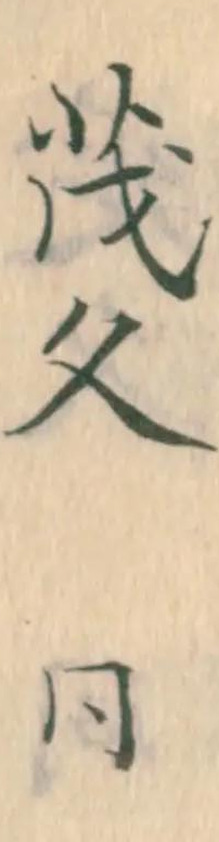泰久同
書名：賀茂社記録. 第23冊
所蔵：国立国会図書館 National Diet Library, JAPAN
